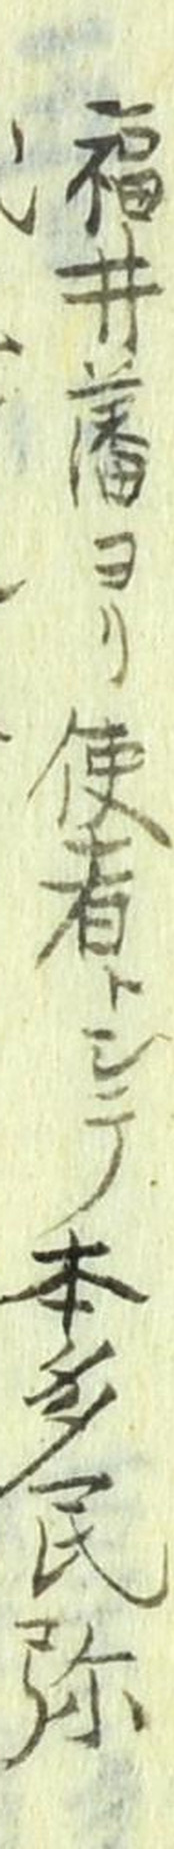福井藩ヨリ使者トシテ本多民弥
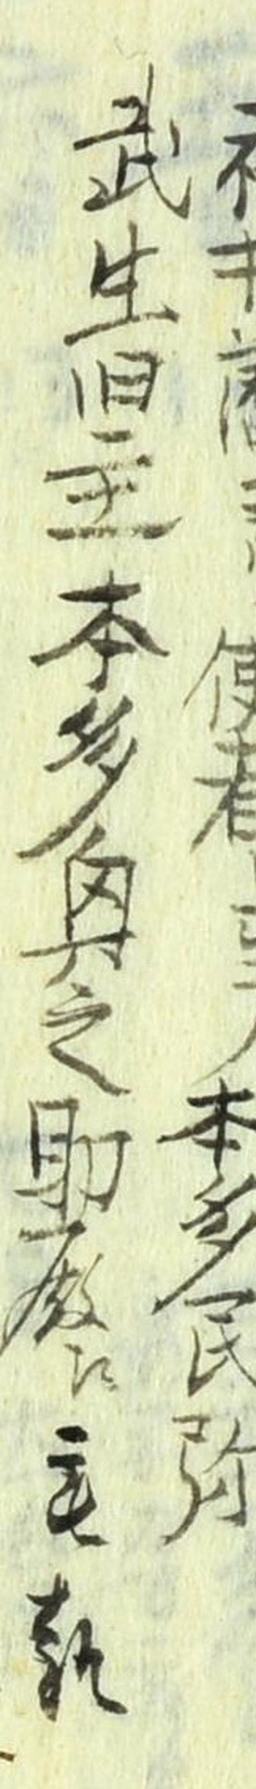武生旧主本多興之助殿江被趣
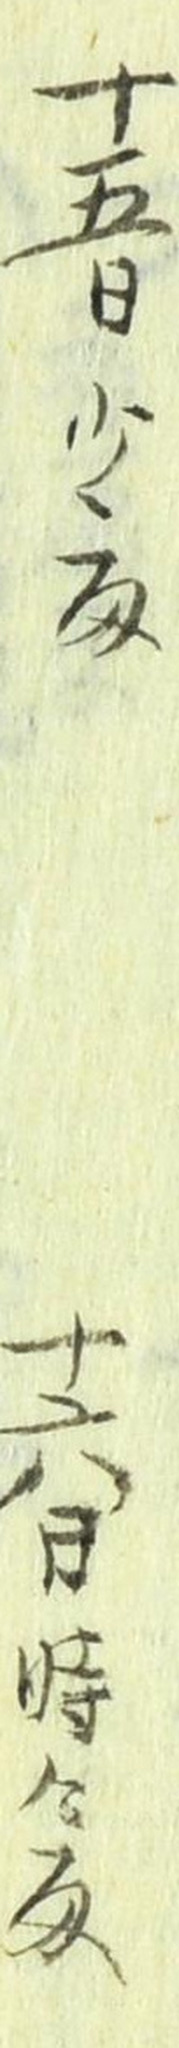十五日少々雨十六日時々雨
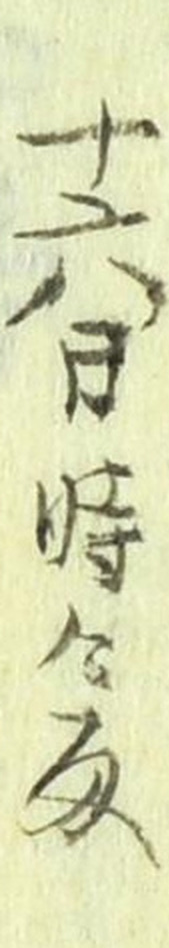十四日時々雨
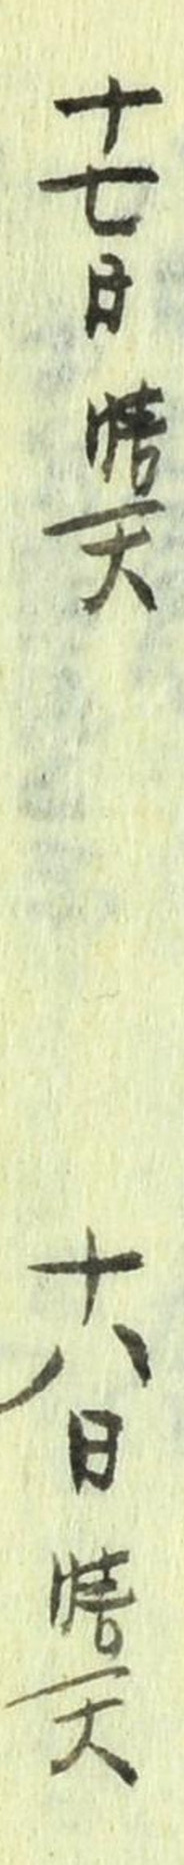十七日晴天十八日晴天
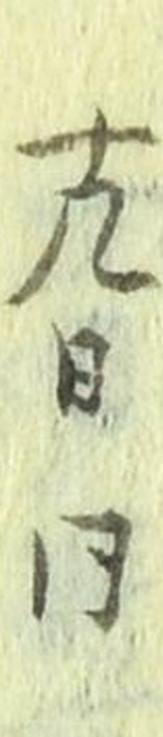十九日同
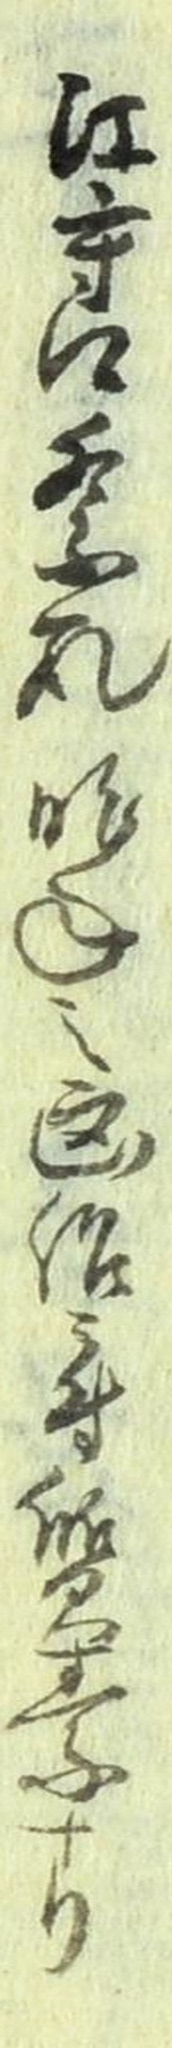江守郷祭礼昨年之凶作ニ付質素ナリ
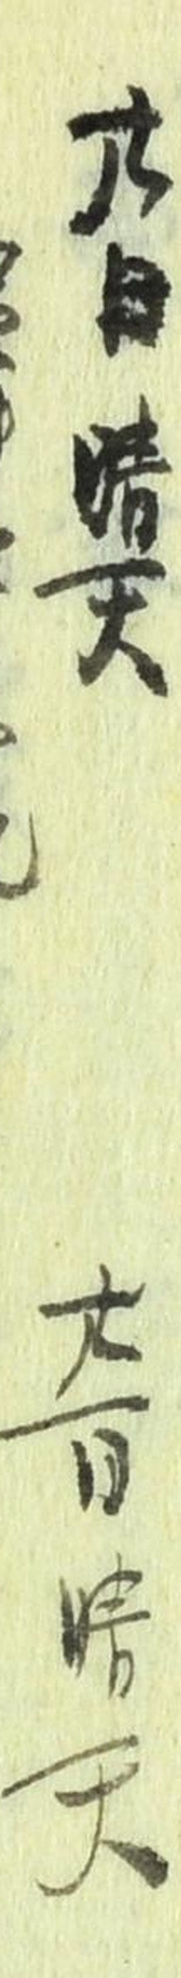廿日晴天廿一日晴天
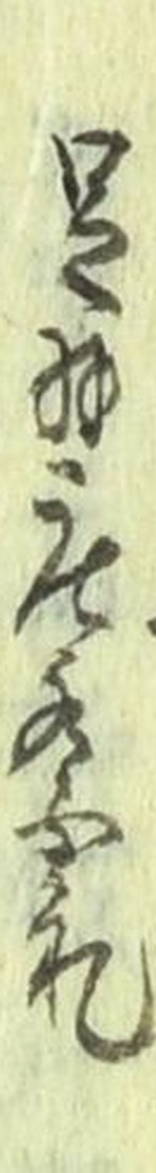足羽庄祭礼
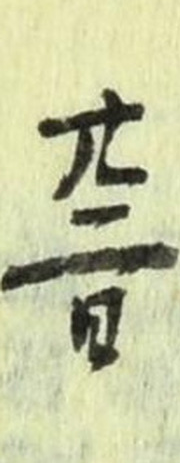廿二日
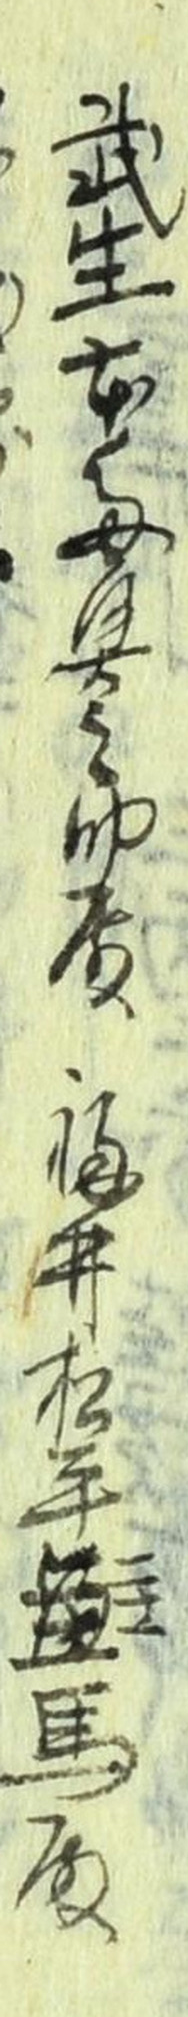武生本多興之助殿福井松平主馬殿
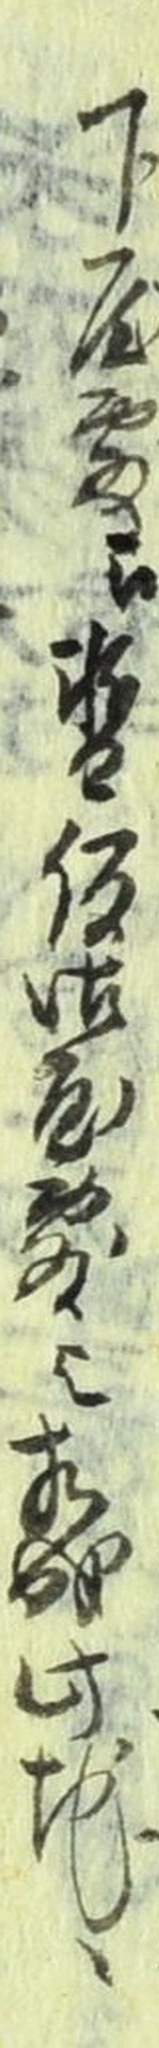下屋敷江暫仮御屋敷与相成此地へ
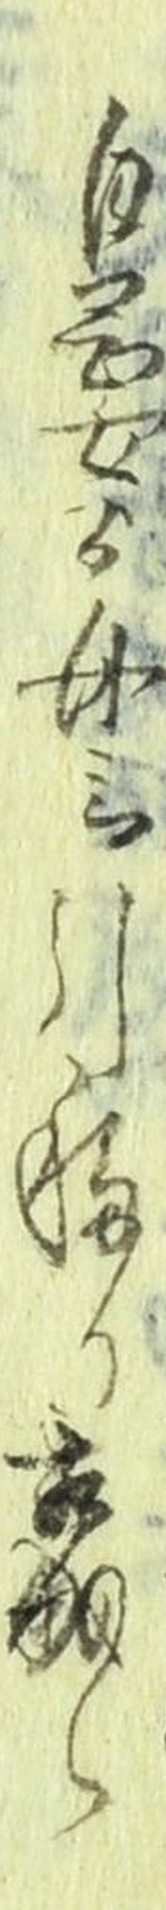白鬼女ゟ舟ニ而引移り相成候
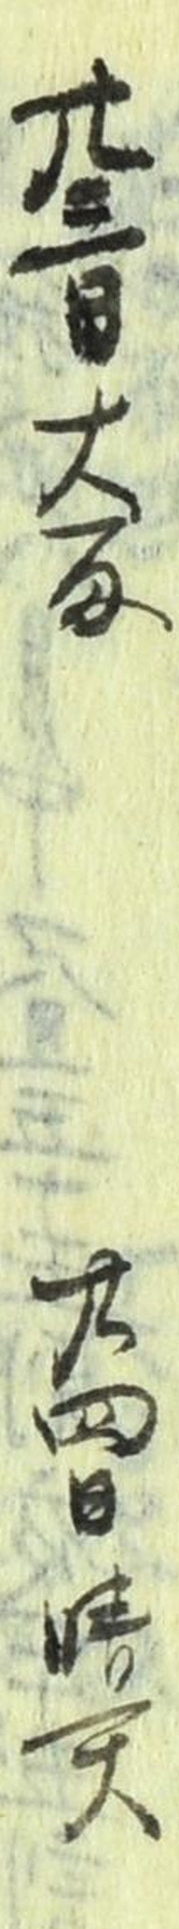廿三日大雨廿四日晴天
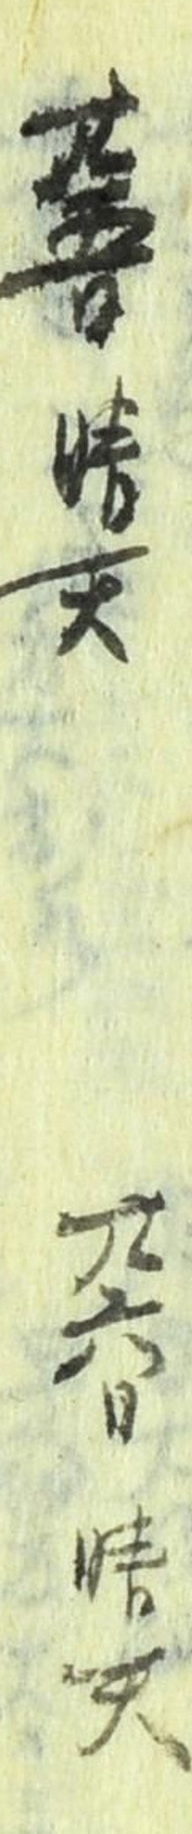廿五日晴天廿六日晴天
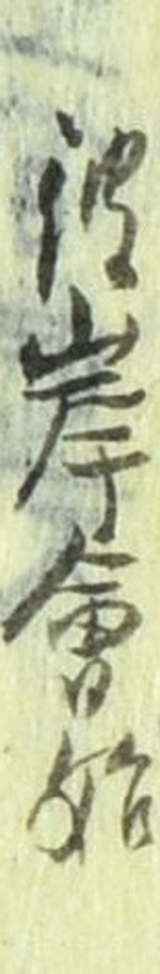彼岸会始
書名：（日記）
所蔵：福井県文書館 Fukui Prefectural Archives
